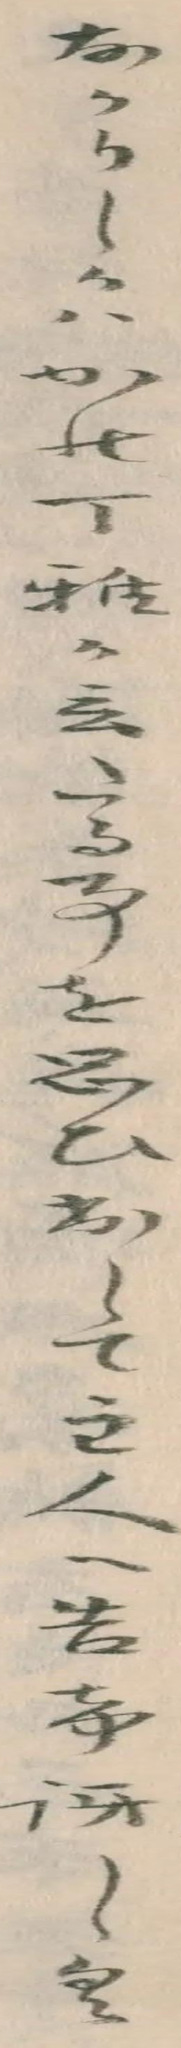なかりしかはかの丁稚か云たる事を思ひ出して主人へ告け訝しく
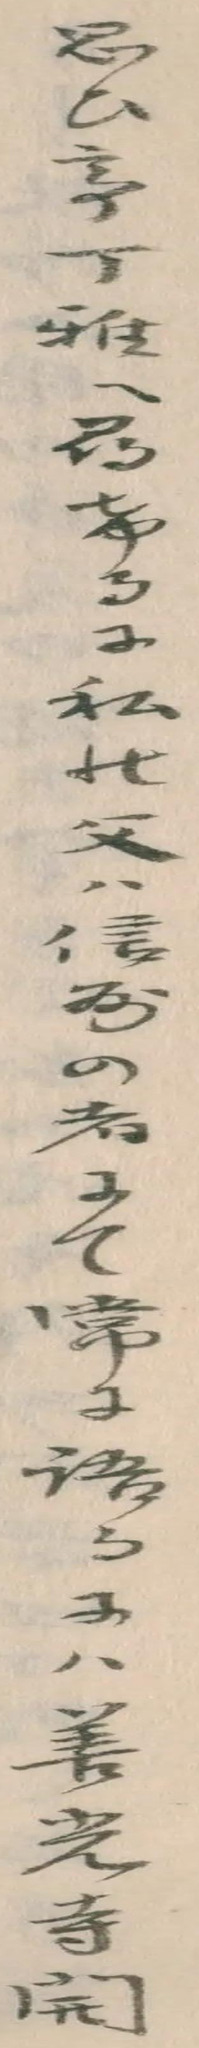思ひて丁稚へ尋ねけるに私の父は信州の者にて常に語るには善光寺開
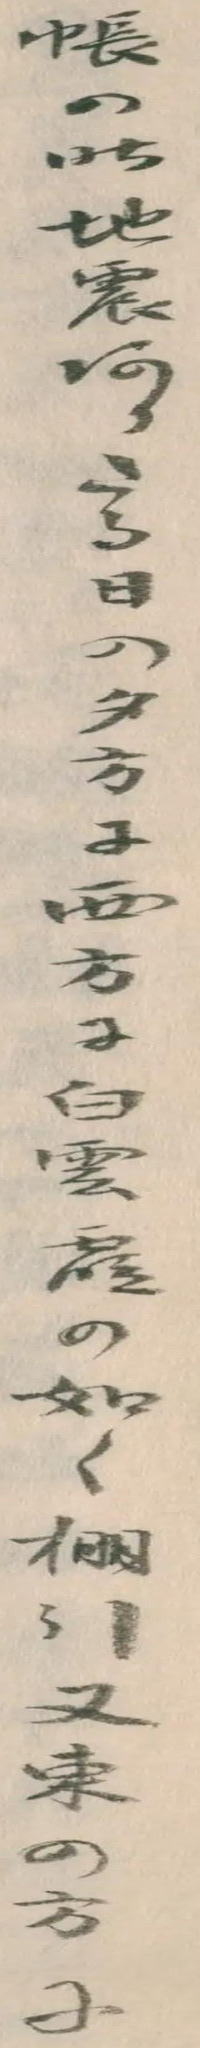帳の時地震ありたる日の夕方に西方に白雲霞の如く棚引又東の方に
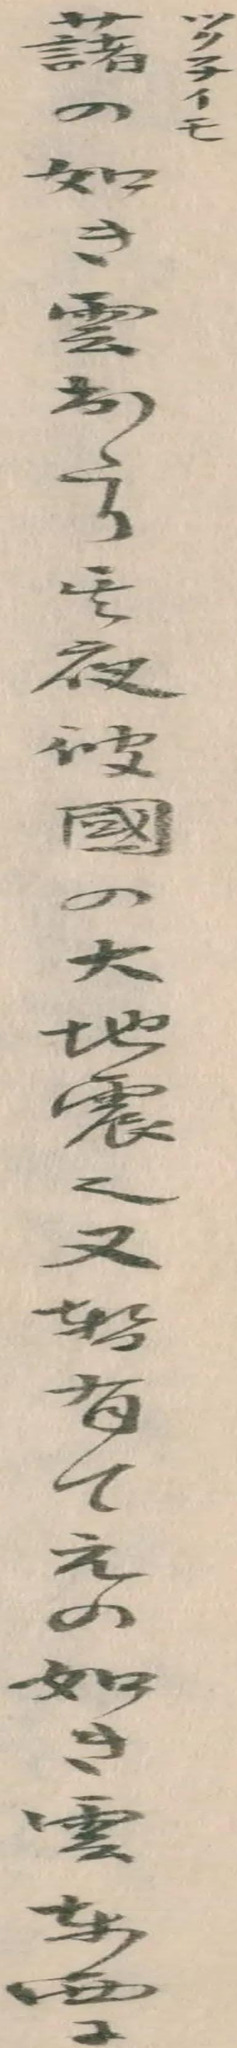藷の如き雲出たり其夜彼国の大地震也又暫有て元の如き雲東西に
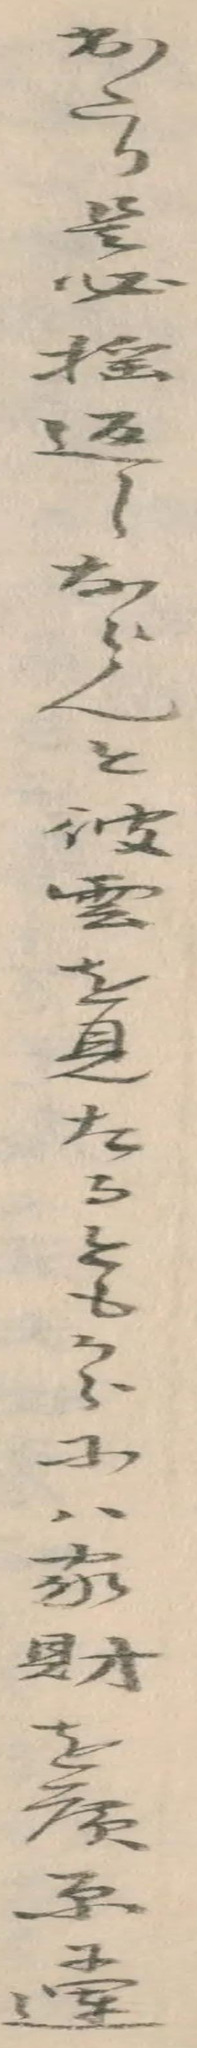出たり是必揺返しならんと彼雲を見たるともからには家財を広原に運

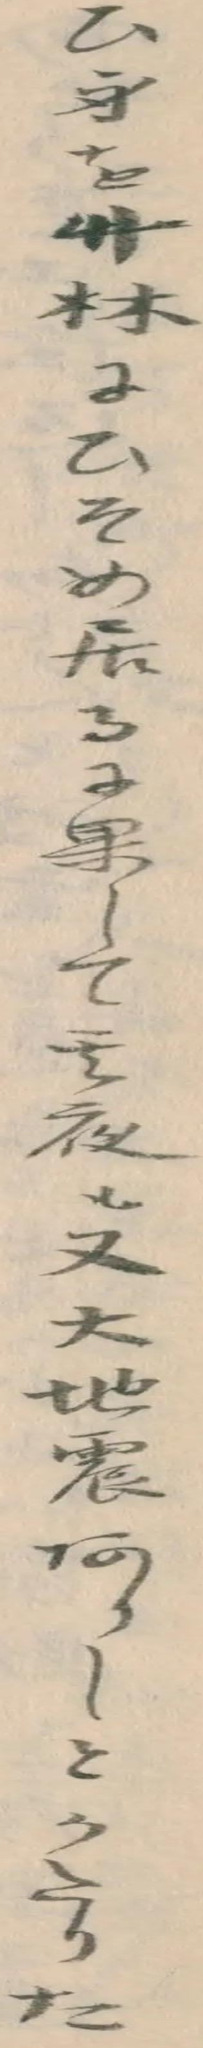ひ身を竹林にひそめ居るに果して其夜も又大地震ありしとかたりた
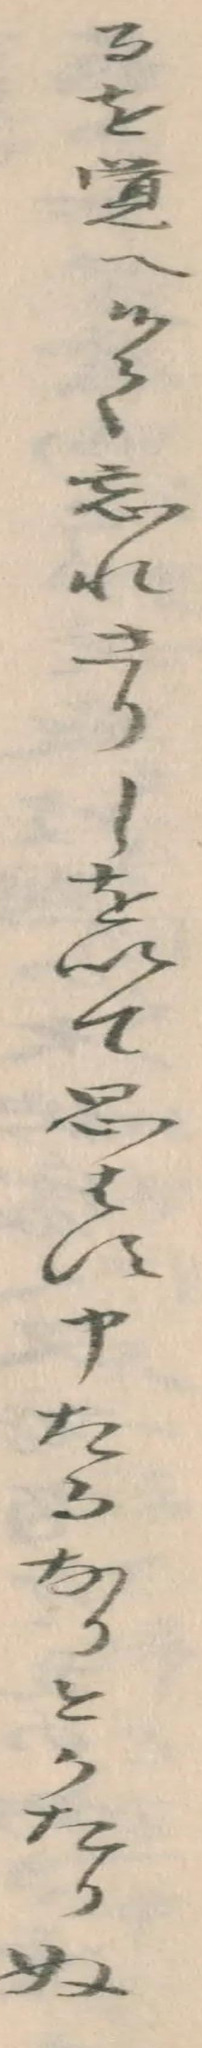るを覚へ候て忘れさりしを以て思はす申たるなりとかたりぬ
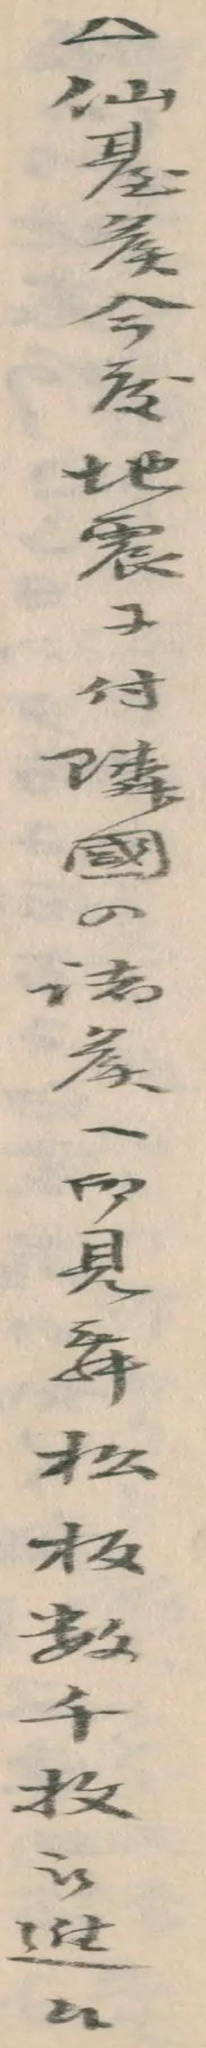△仙台侯今度地震に付隣国の諸侯へ御見舞松板数千枚被進候
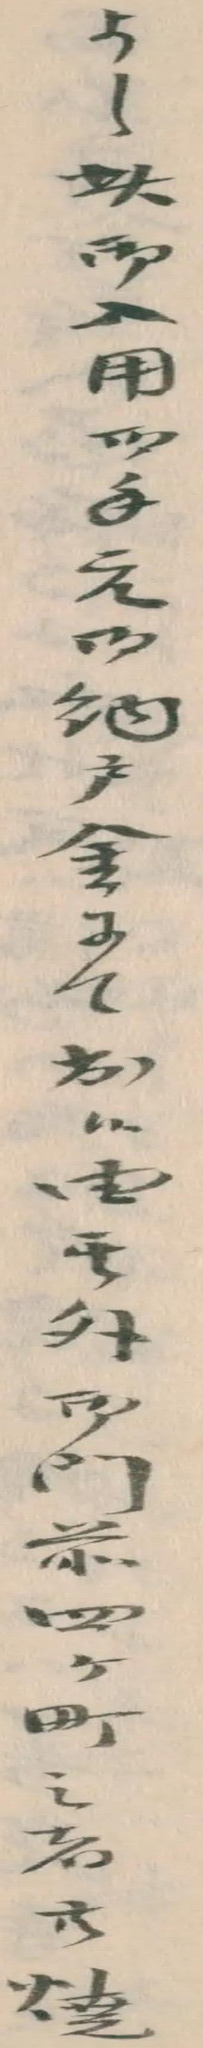よし此御入用御手元御納戸金にて出候由其外御門前四ヶ町之者共焼
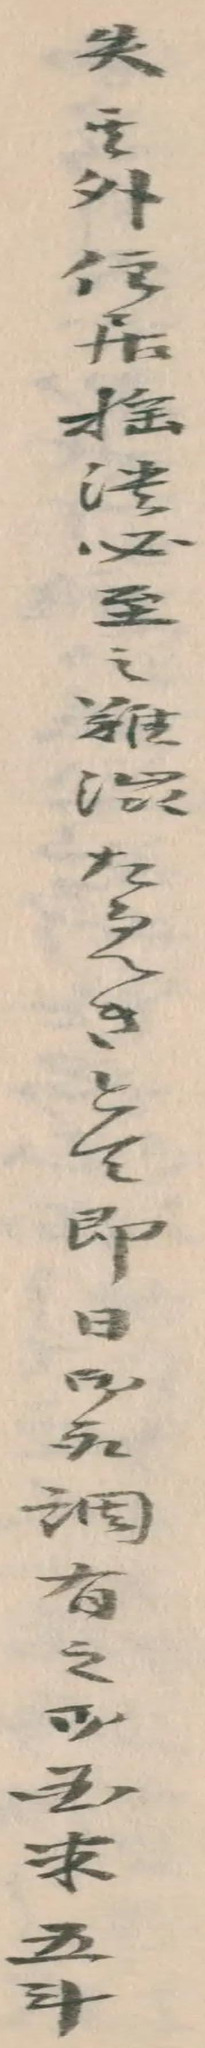失其外住居揺潰必至之難渋たるへきとて即日御取調有之御国米五斗
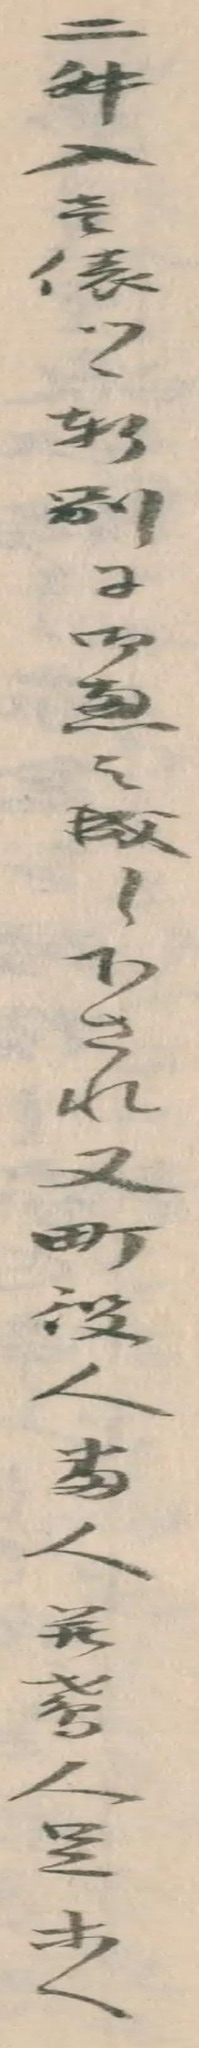二升入壱俵つゝ軒別に御恵み成し下され又町役人番人并鳶人足等へ
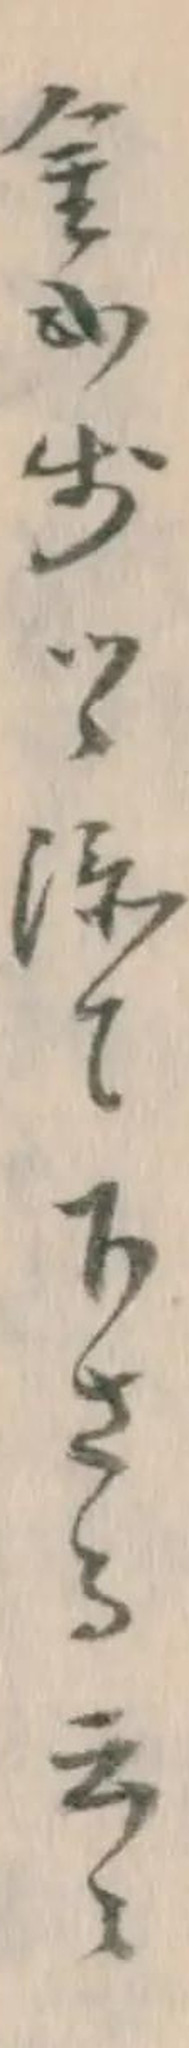金弐歩つゝ添て下さる云々
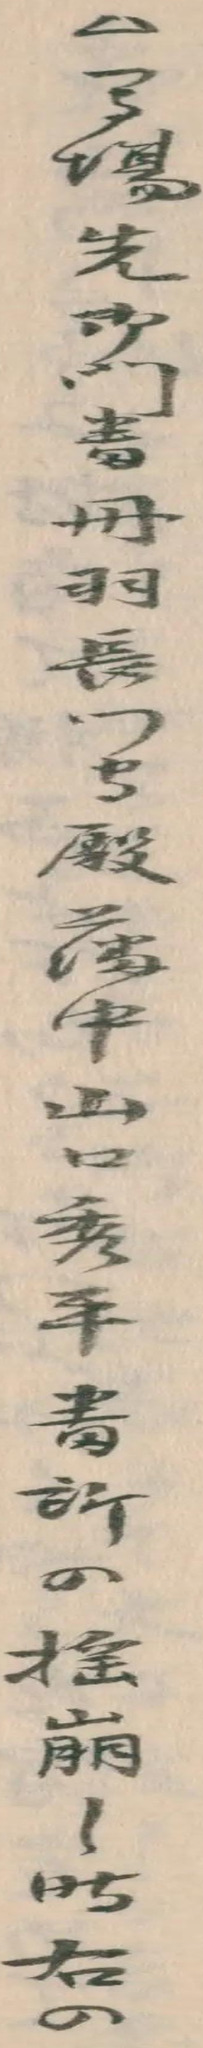△馬場先御門番丹羽長門守殿藩中山口秀平番所の揺崩し時右の
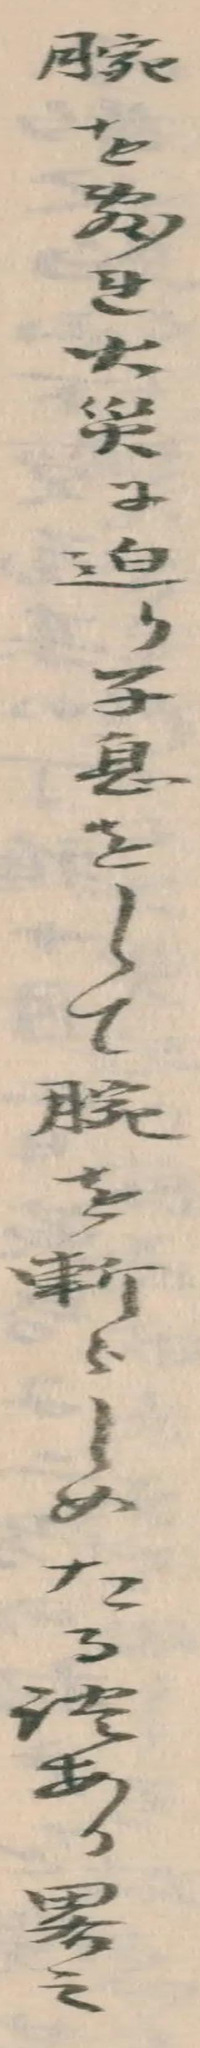腕を敷き火災に迫り子息をして腕を斬らしめたる談あり略之
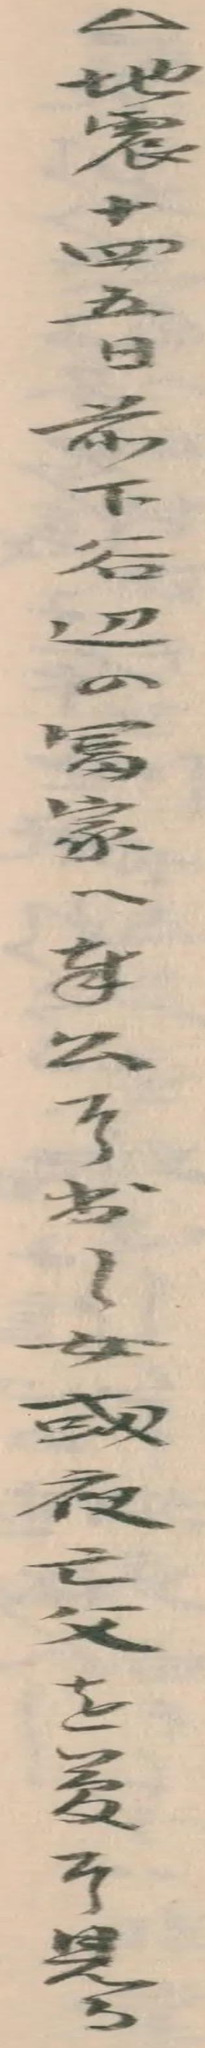△地震十四五日前下谷辺の冨家へ奉公に出し女或夜亡父を爰に見る
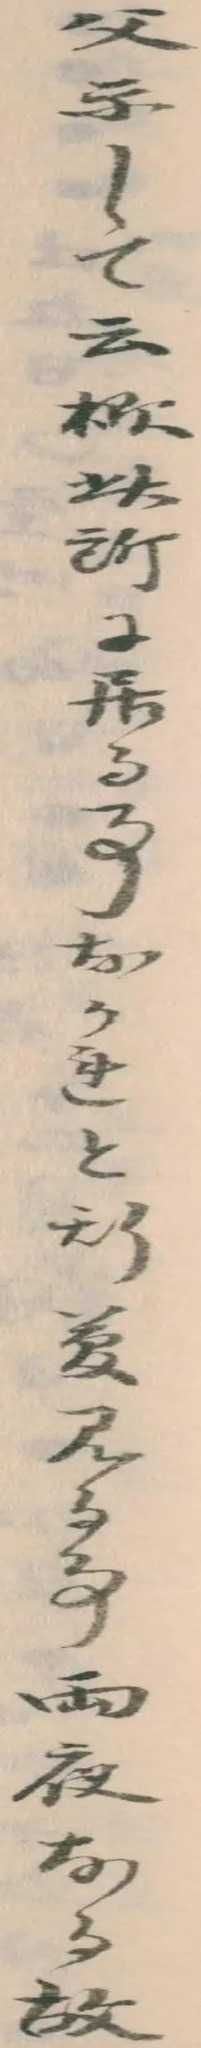父示して云様此所に居る事なかれと斯爰見る事両夜なる故
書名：地災撮要. 巻10(地震之部) 上,下
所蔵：国立国会図書館 National Diet Library, JAPAN
